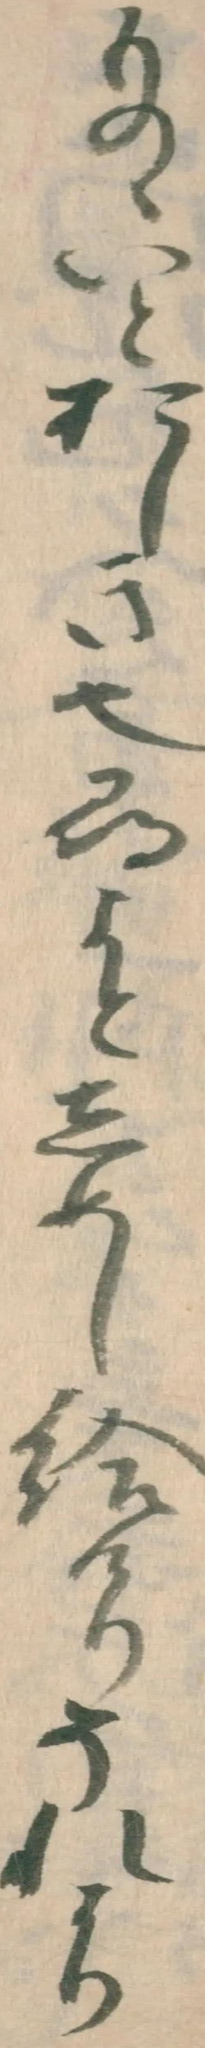ものゝいとおしき也尋よとしめし給けりそれより
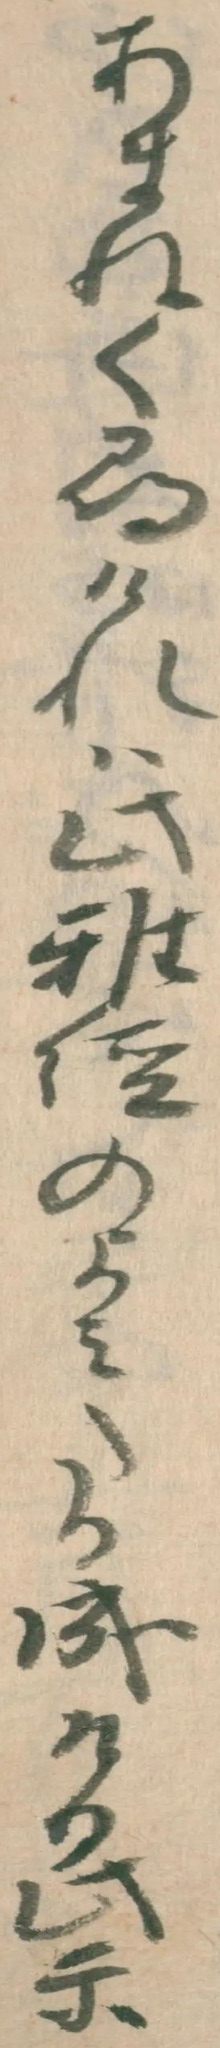あまねく尋けれは此雅経のよみたる成けり此示
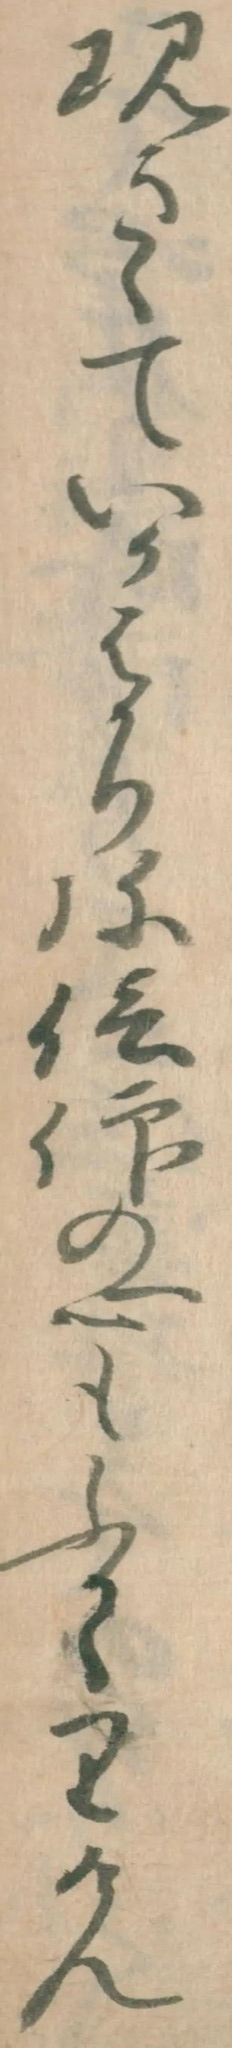現きゝていかはかり弥信仰の心もふかゝりけん

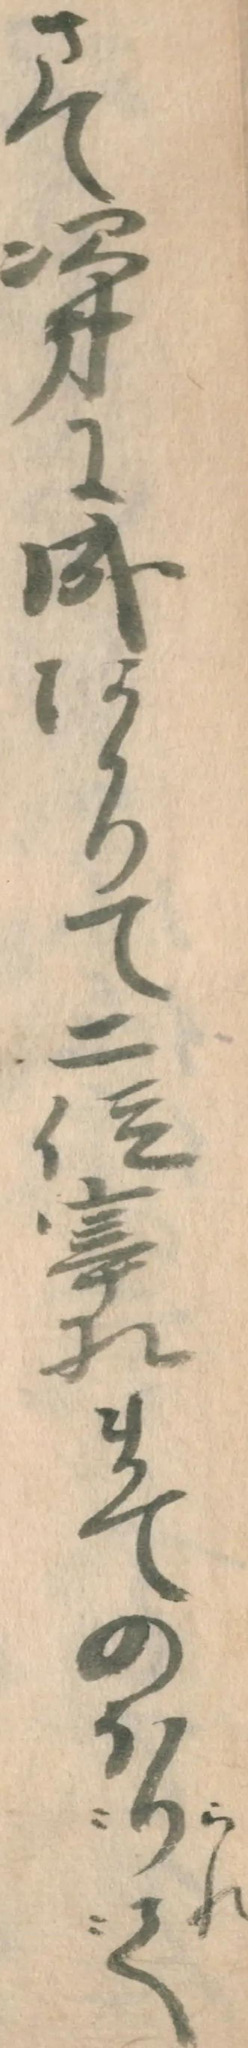さて次第に成あかりて二位宰相まてのほりて
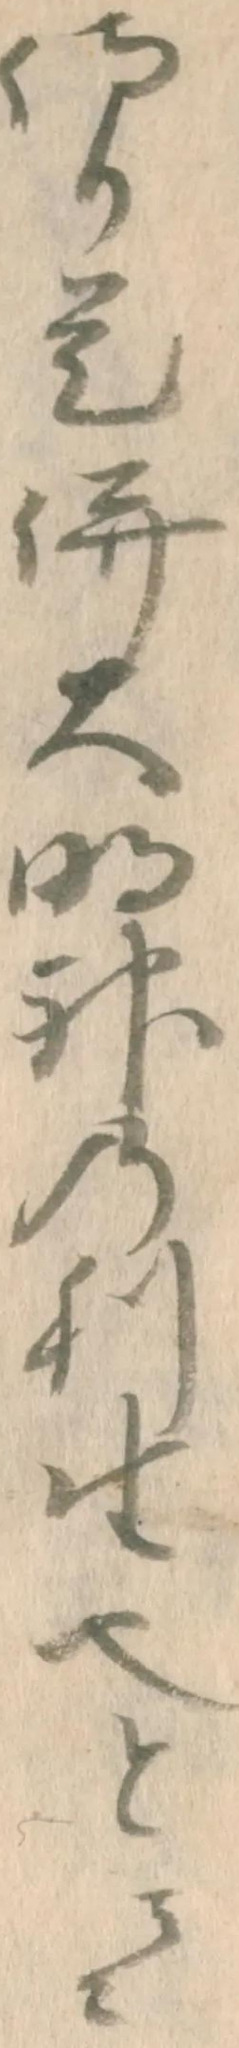侍り是併大明神の利生也と云々
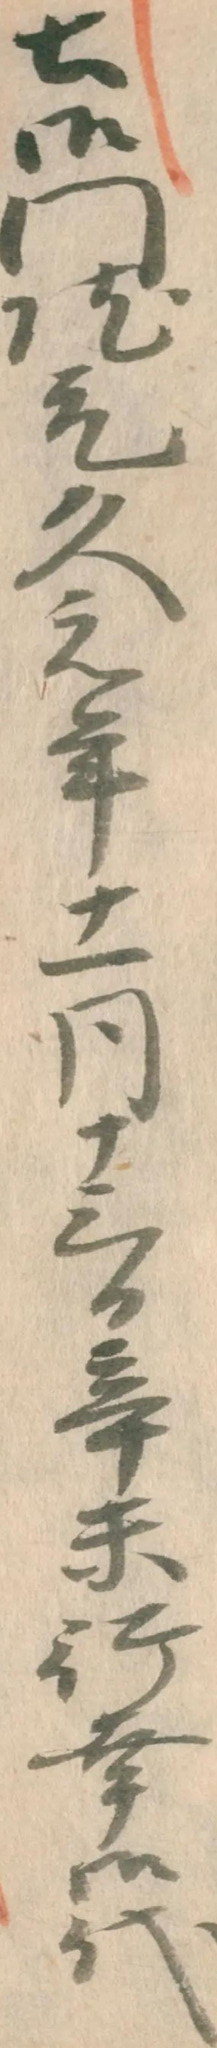土御門院元久元年十一月十三日辛未行幸御代
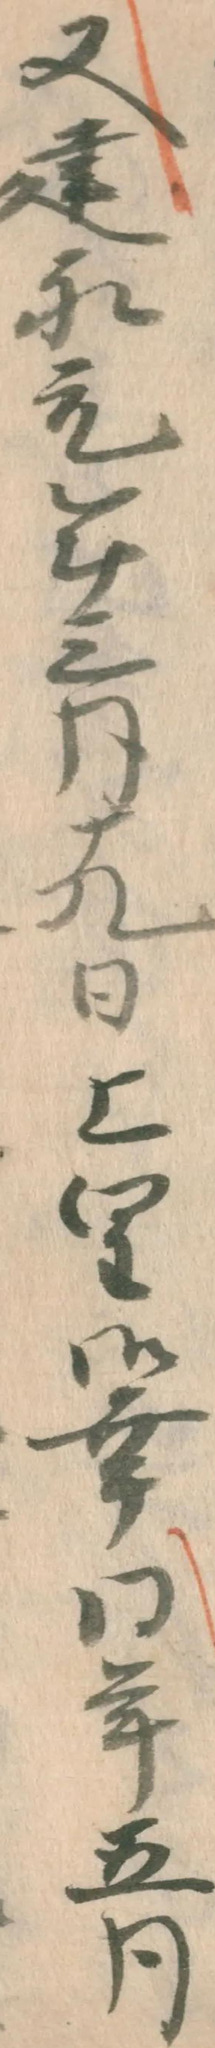又建永元年三月十九日上皇御幸同年五月
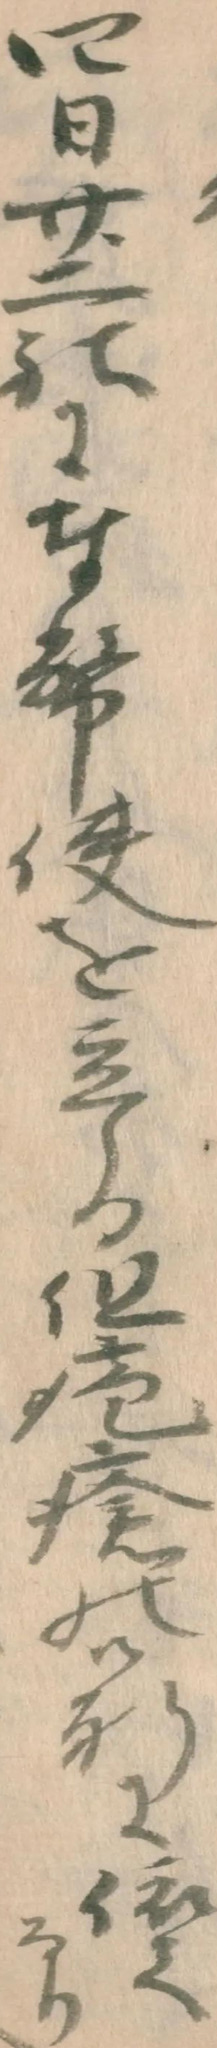四日廿二社に奉幣使を立らる但疱瘡の御祈に依てなり
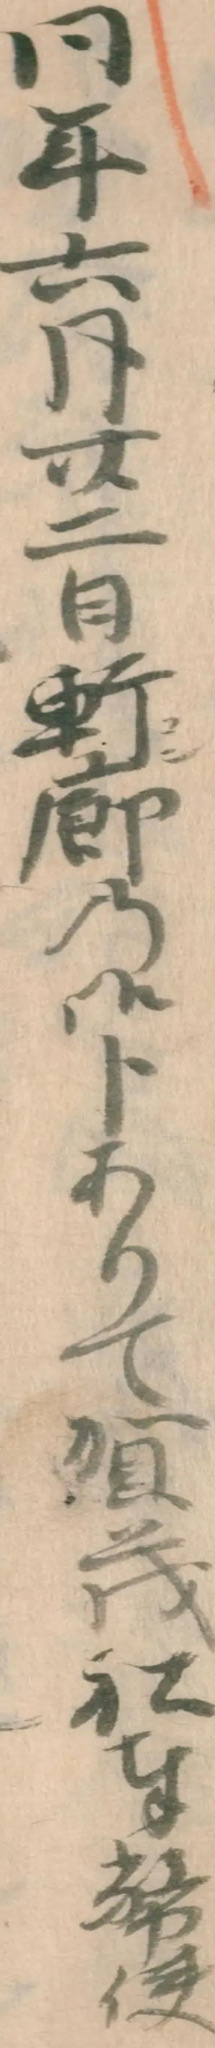同年六月廿二日軒廊の御卜ありて賀茂社奉幣使
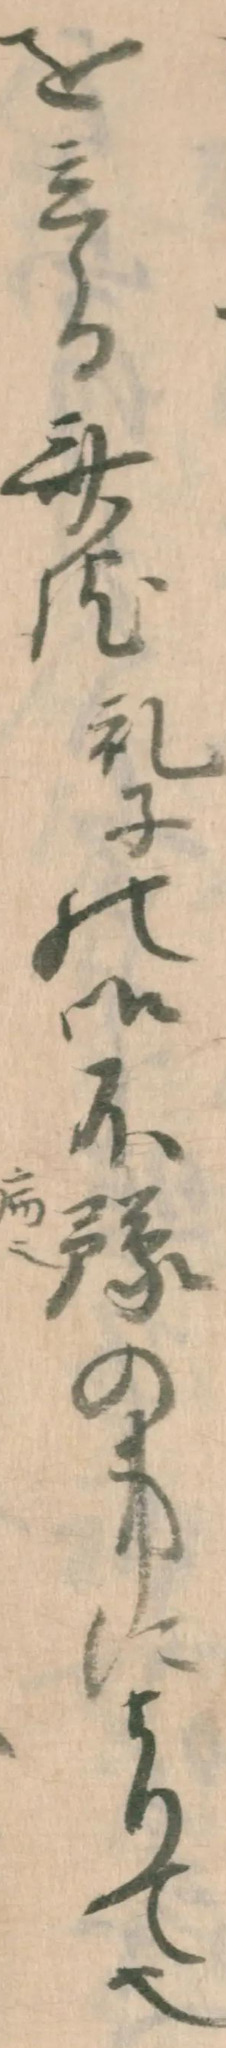を立らる齋院礼子の御不豫の事によりて也
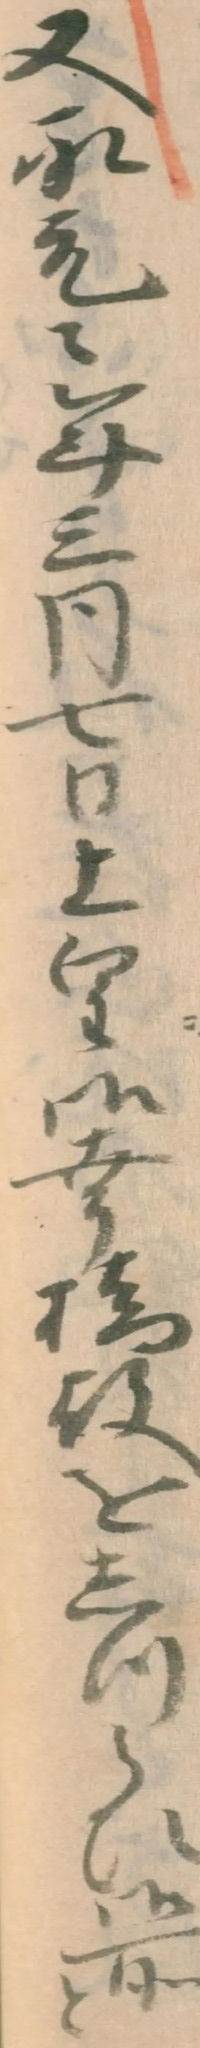又承元々年三月七日上皇御幸橋殿をしつらひ御所と
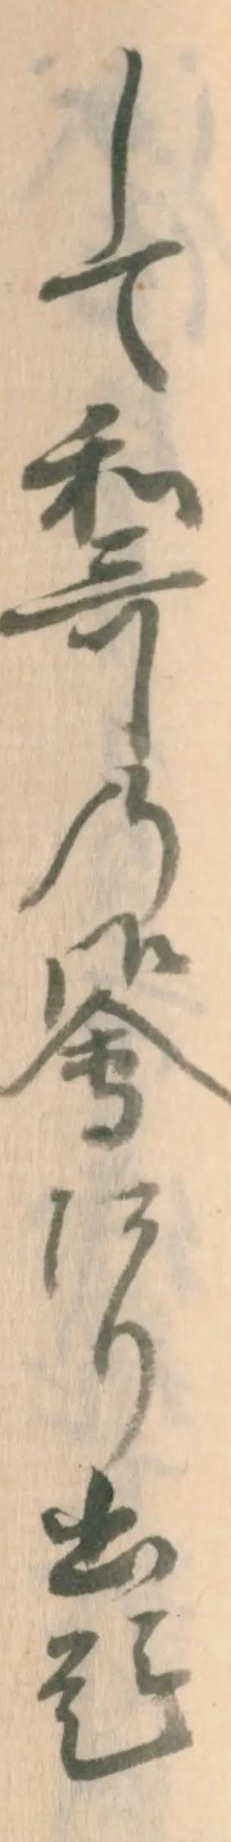して和哥の御会あり出題
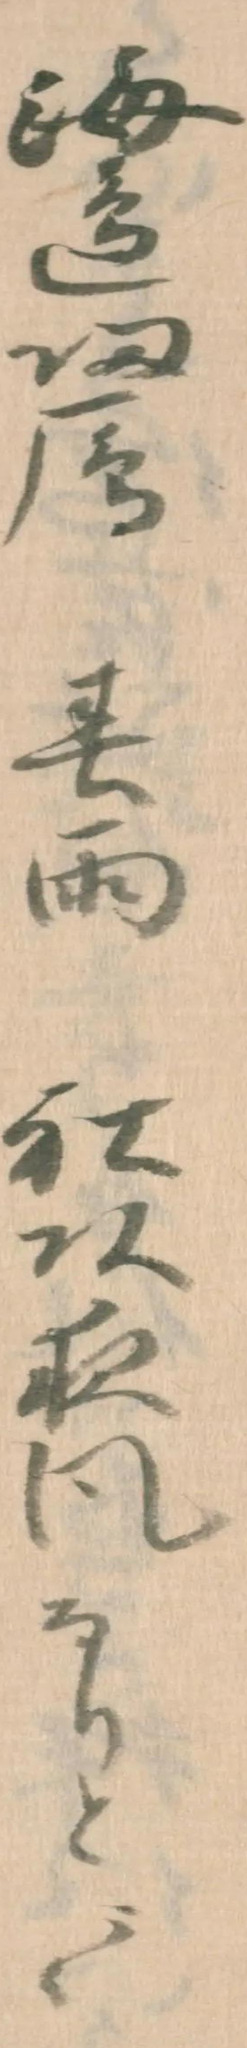海辺帰鳫春雨社頭夜風なりと云々
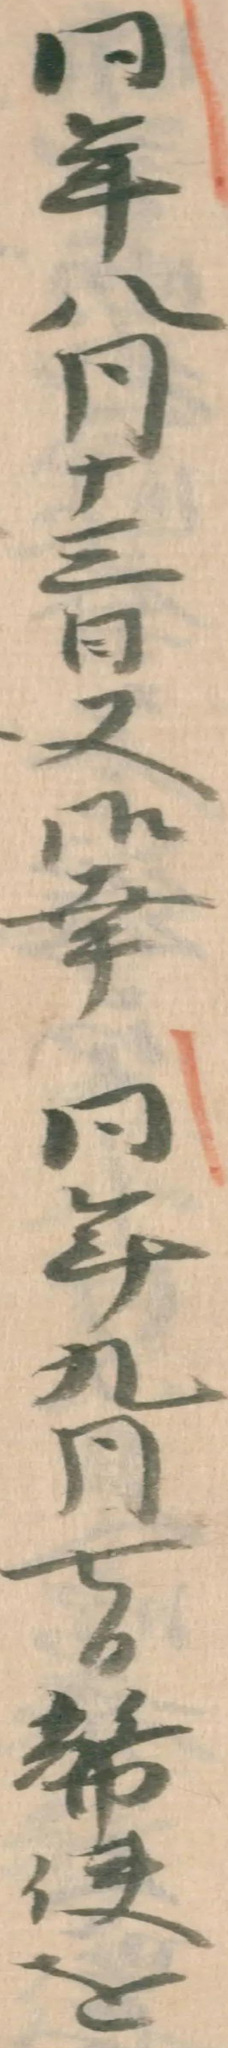同年八月十三日又御幸同年九月七日幣使を
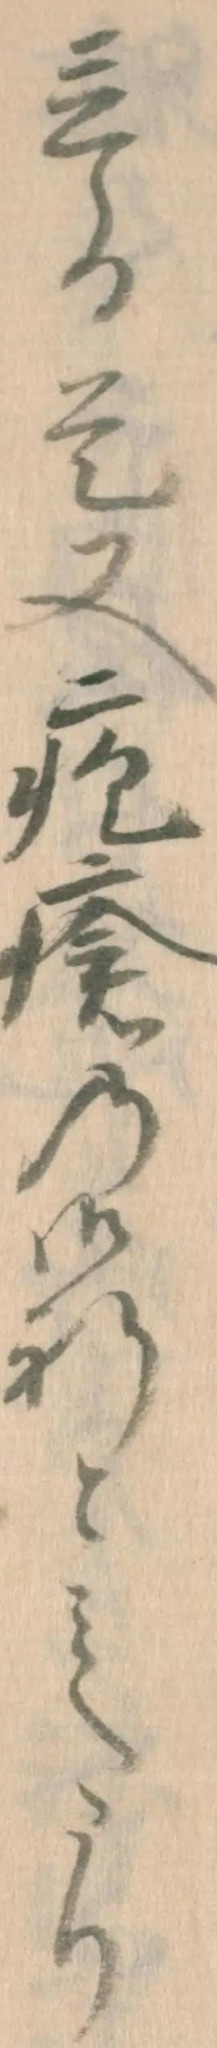立らる是又疱瘡の御祈とみえたり
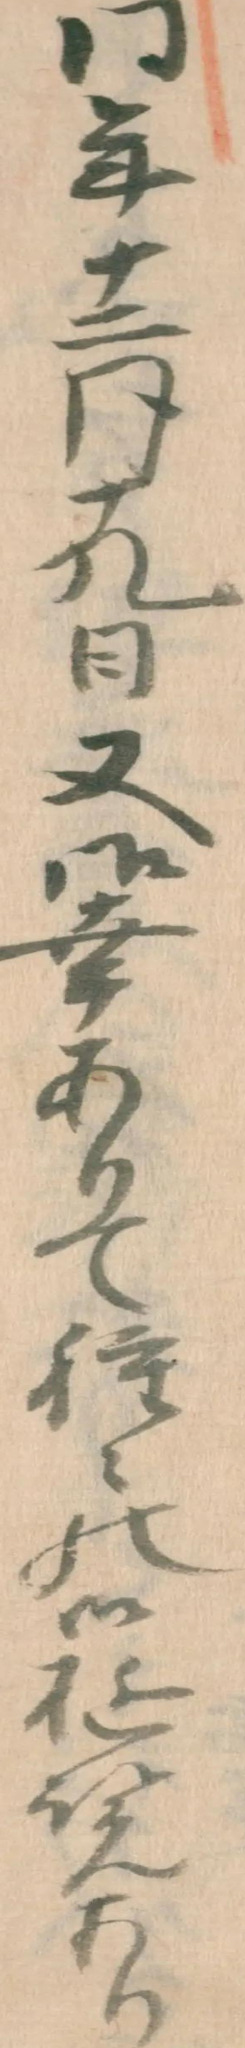同年十二月十九日又御幸ありて種々の御遊覧あり
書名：賀茂社記録. 第1冊
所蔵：国立国会図書館 National Diet Library, JAPAN
